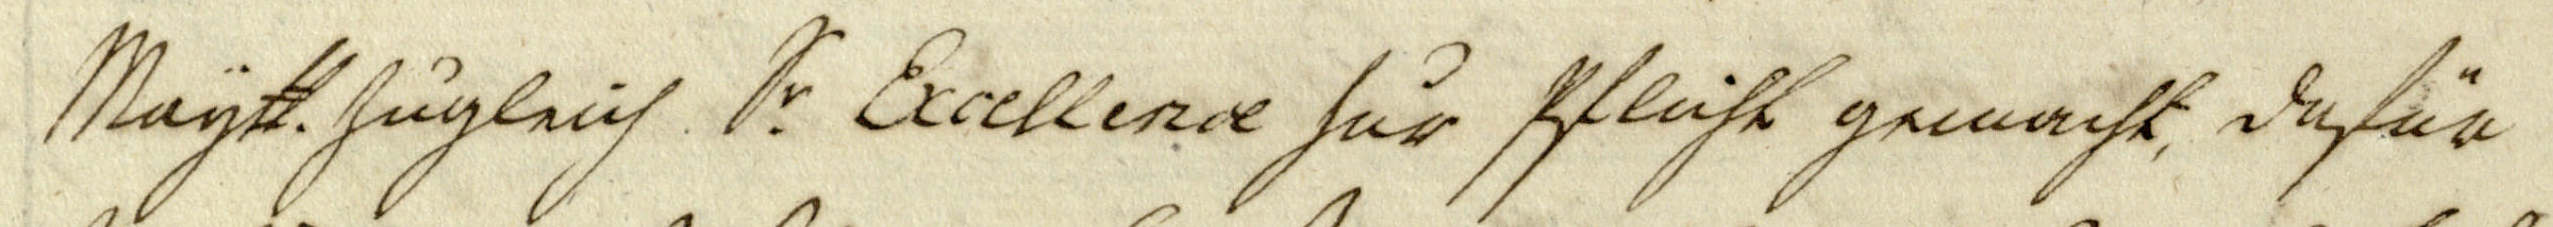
Maÿtt. zugleich Sr. Excellence zur Pflicht gemacht, dafür
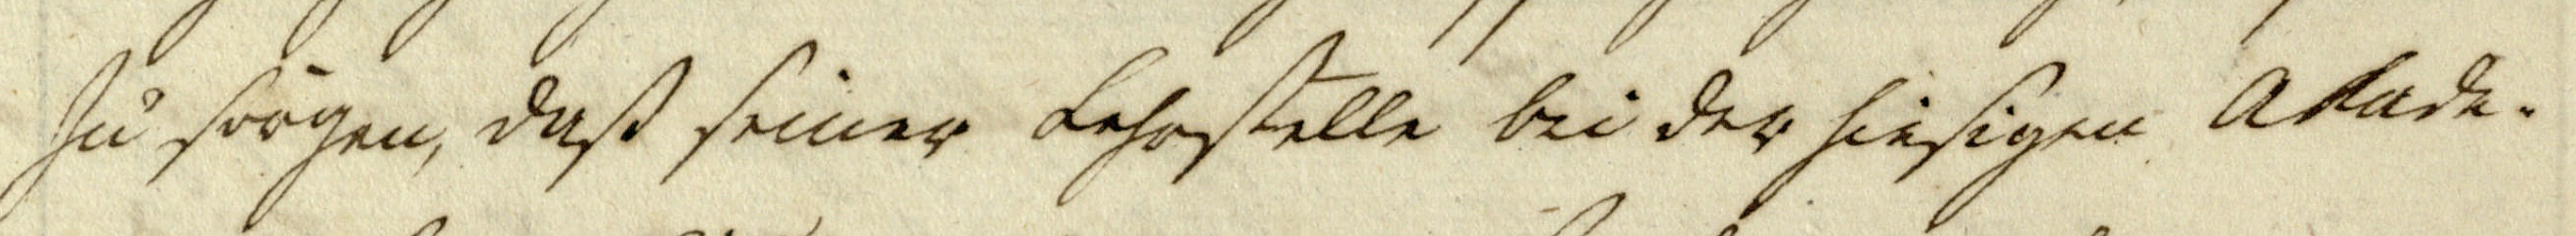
zu sorgen, daß seiner Lehrstelle bei der hiesigen Akade¬
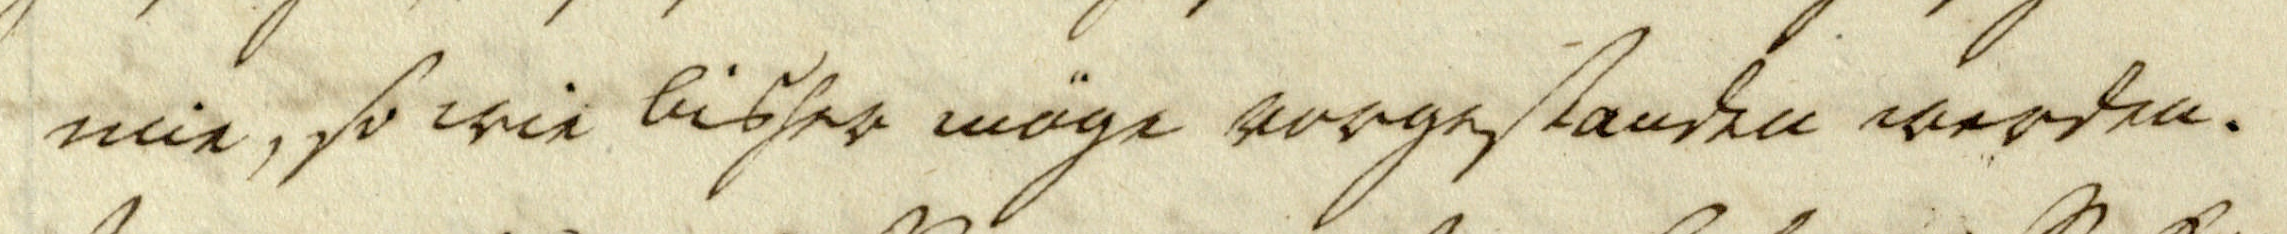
mie, so wie bisher möge vorgestanden werden.
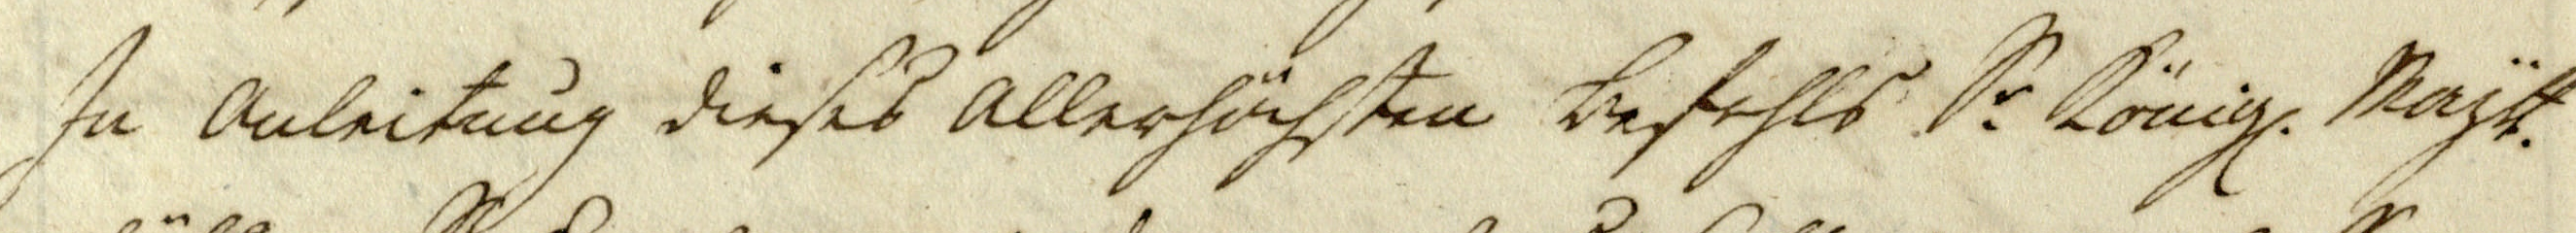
In Anleitung dieses allerhöchsten Befehls Sr. Königl. Maÿtt.
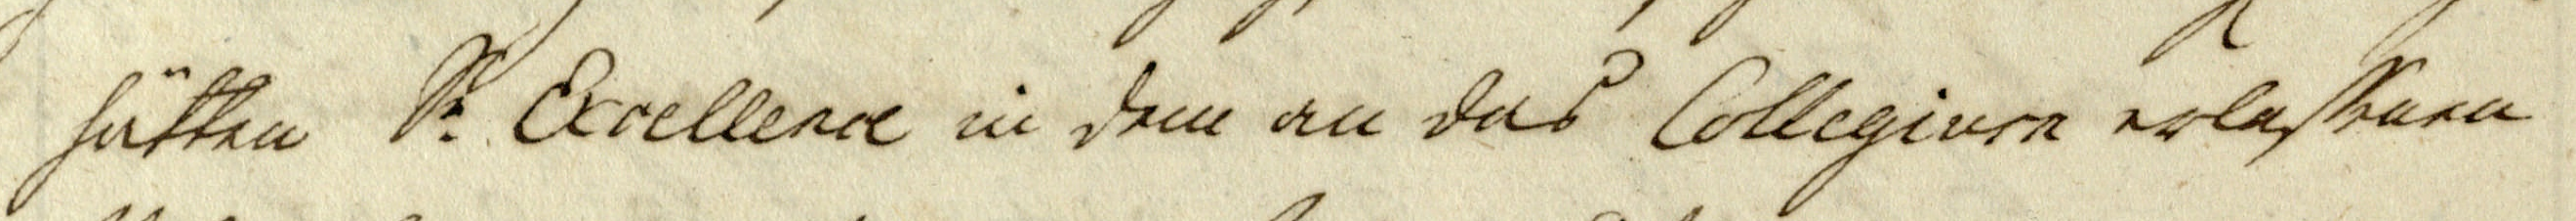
hätten Sr. Excellence in dem an das Collegium erlassene
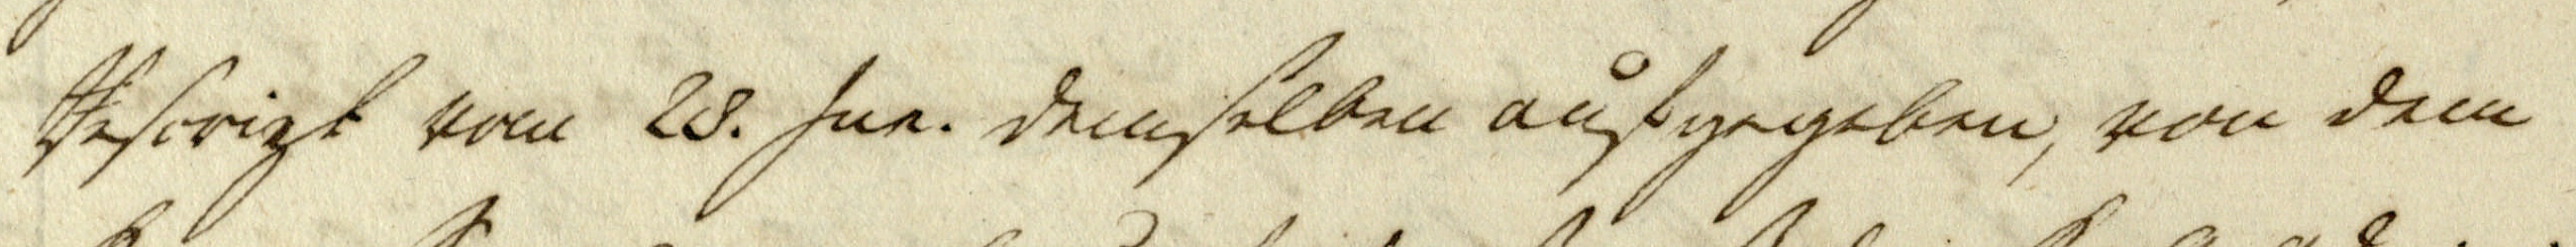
Rescript vom 28. Jun. demselben aufgegeben, von dem
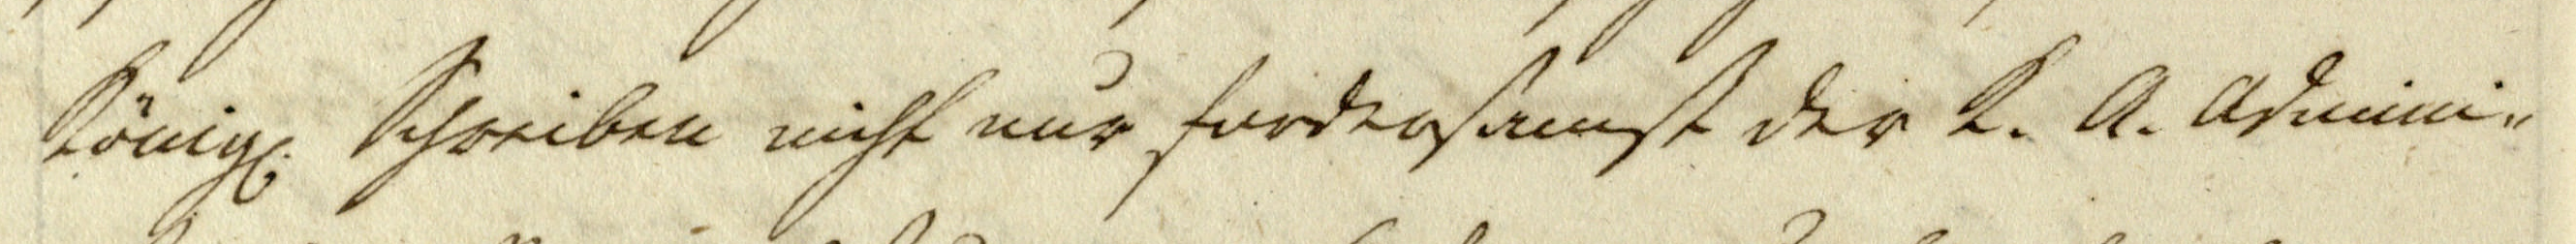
Königl. Schreiben nicht nur fordersamst der K. A. Admini¬
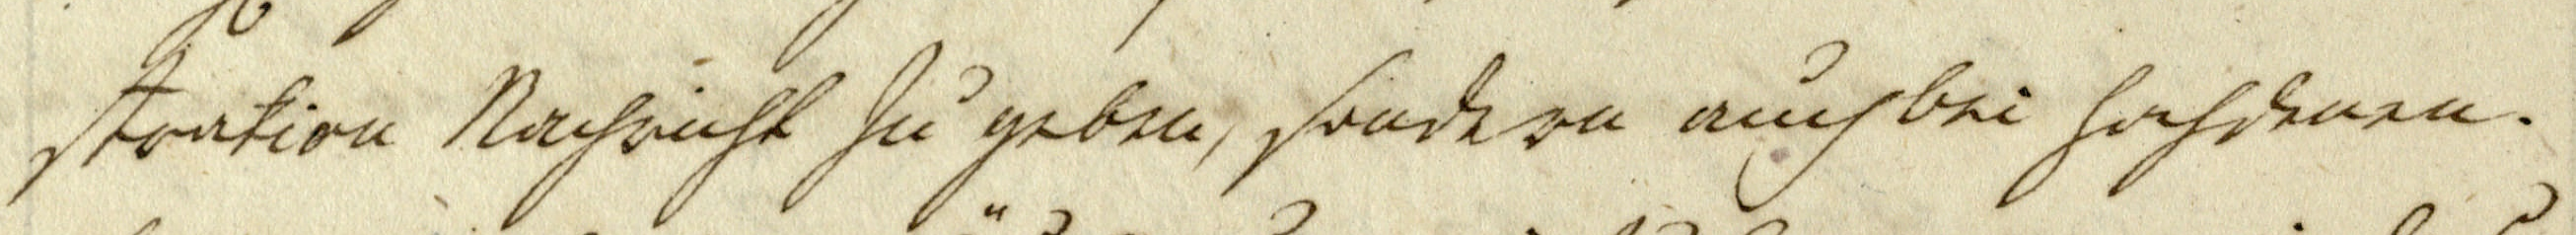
stration Nachricht zu geben, sondern auch bei hochdenen¬
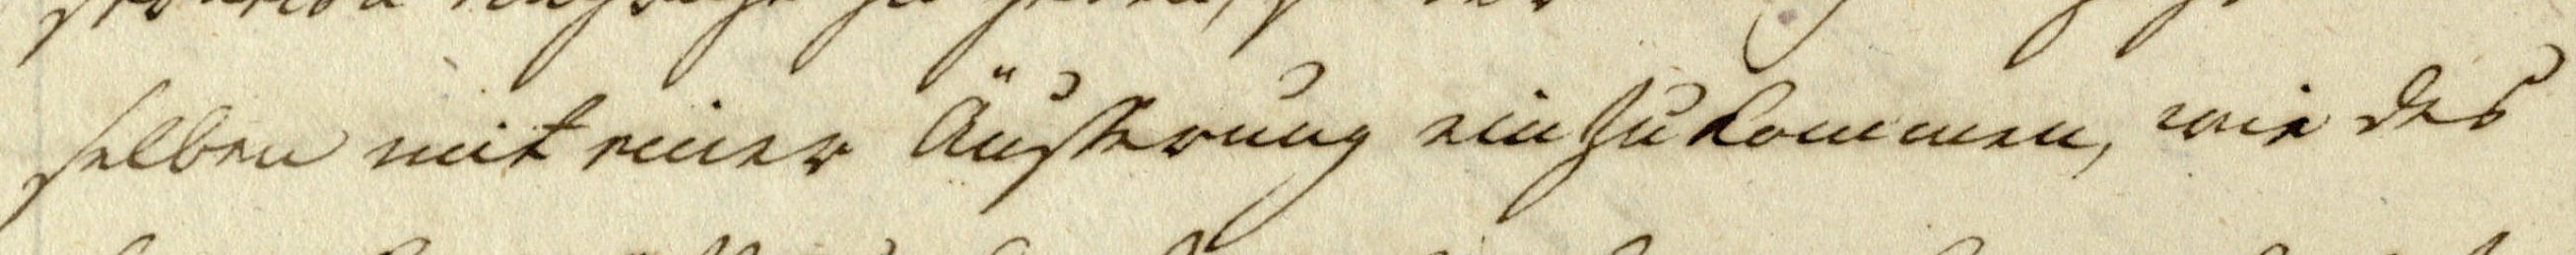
selben mit einer Äusserung einzukommen, wie des
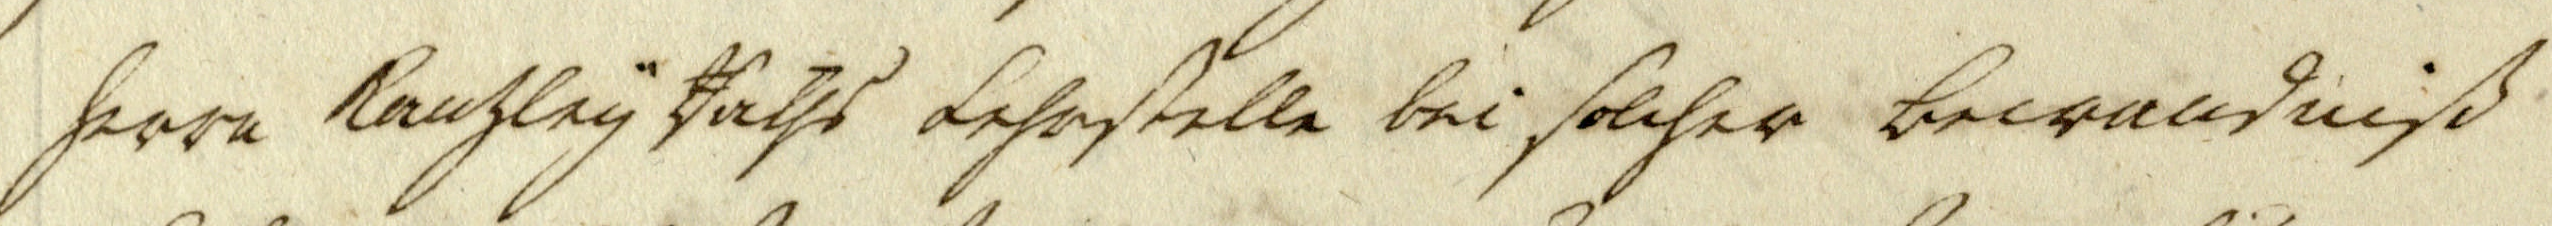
herrn Kanzleÿ Raths Lehrstelle bei solcher Bewandniß
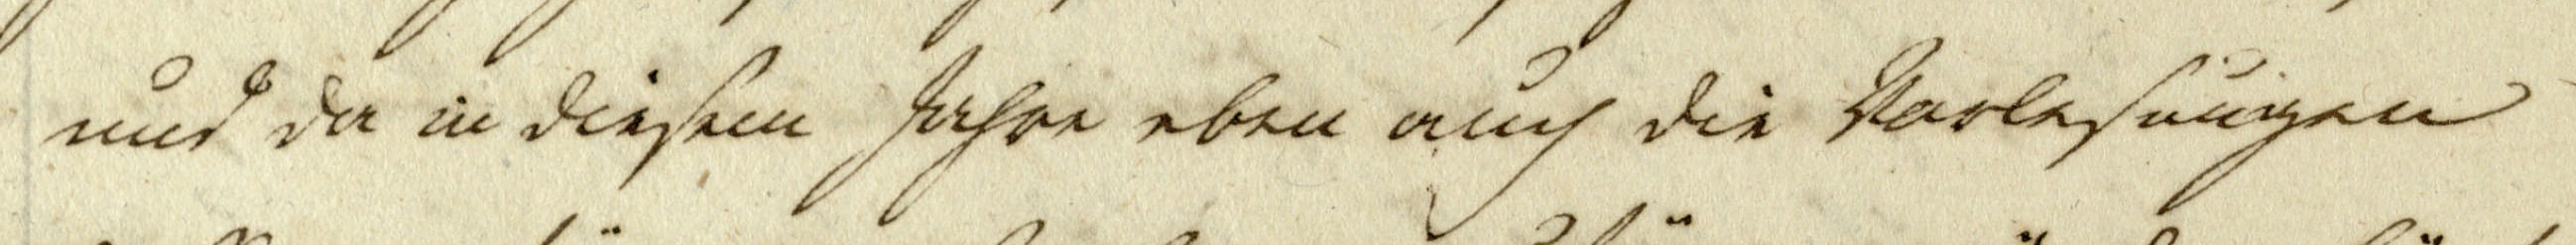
und da in diesem Jahre eben auch die Vorlesungen
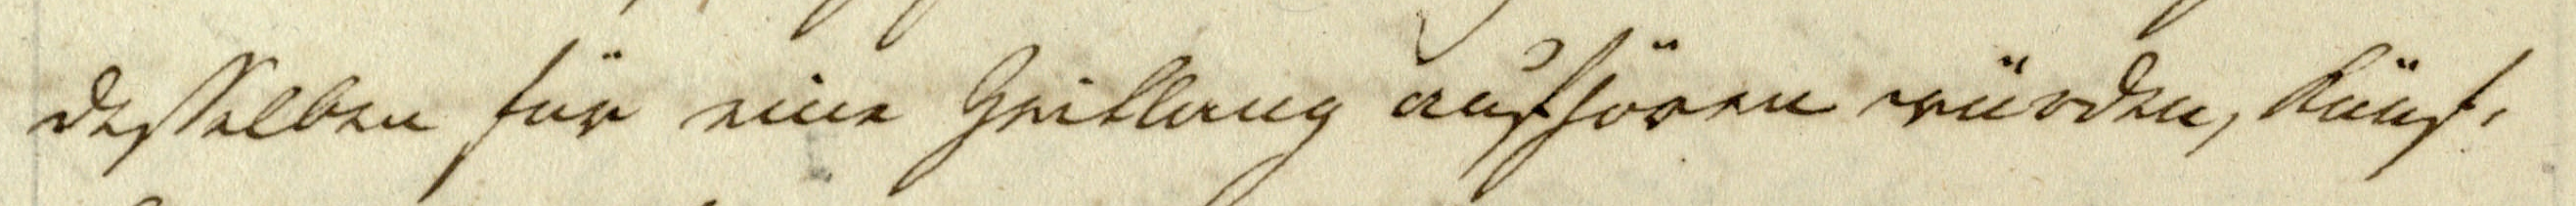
desselben für eine Zeitlang aufhören würden, künf¬
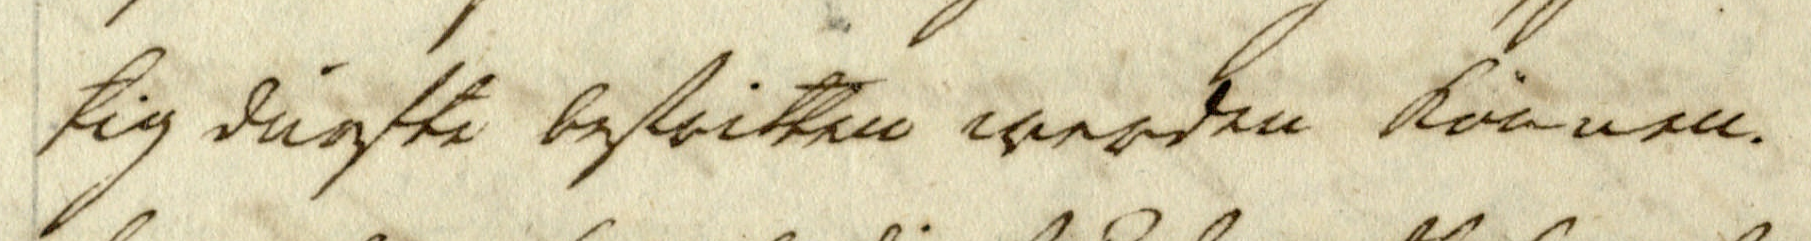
tig dürfte bestritten werden können.
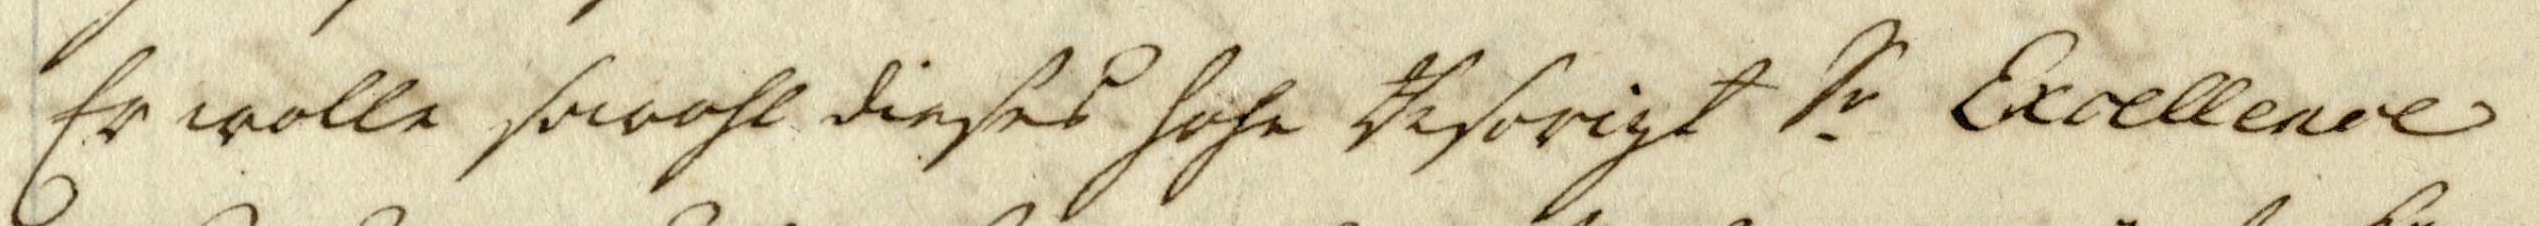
Er wolle sowohl dieses hohe Rescript Sr. Excellence
